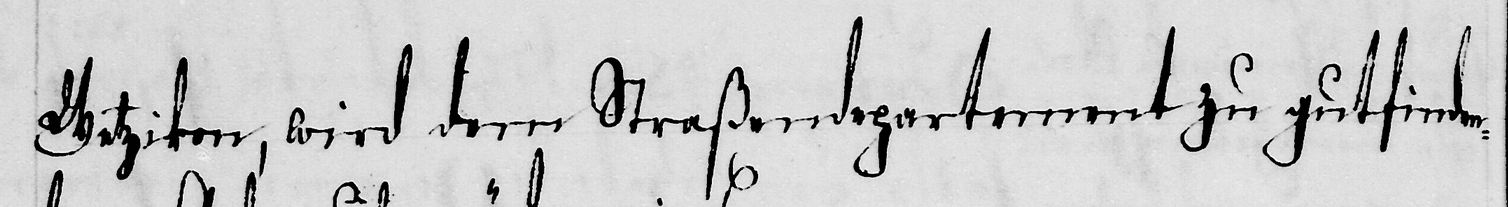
Wetzikon, wird dem Straßendepartement zu gutfinde¬
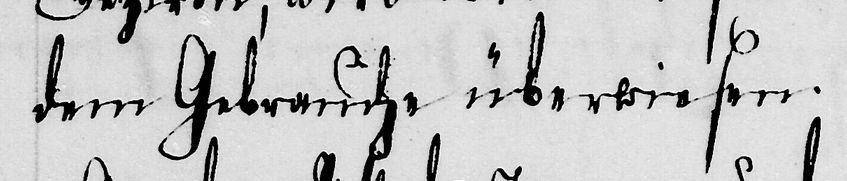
ndem Gebrauche überwiesen.
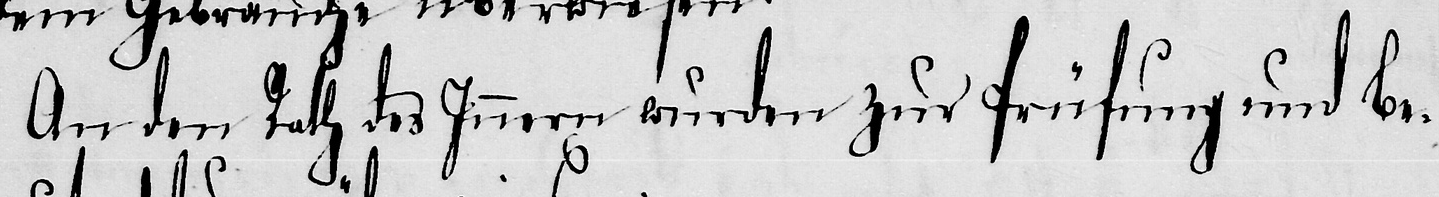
An den Rath des Innern wurden zur Prüfung und Be¬
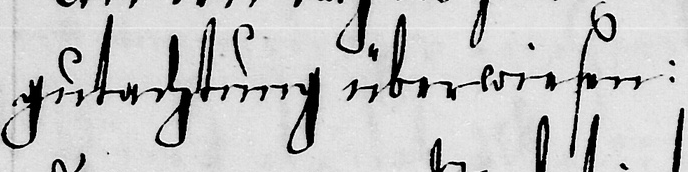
gutachtung überwiesen:
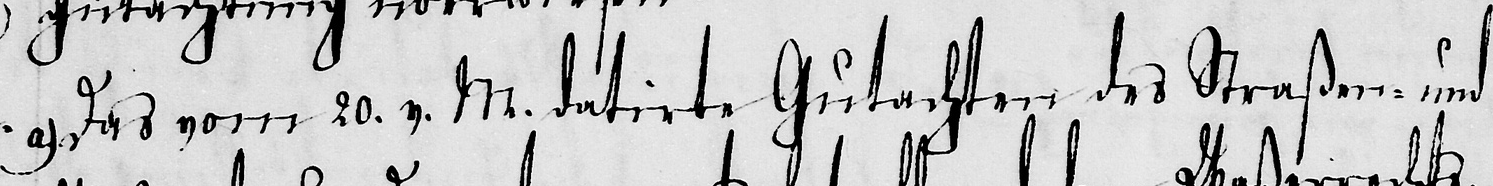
a.) Das vom 20. v. M. datirte Gutachten des Straßen- und
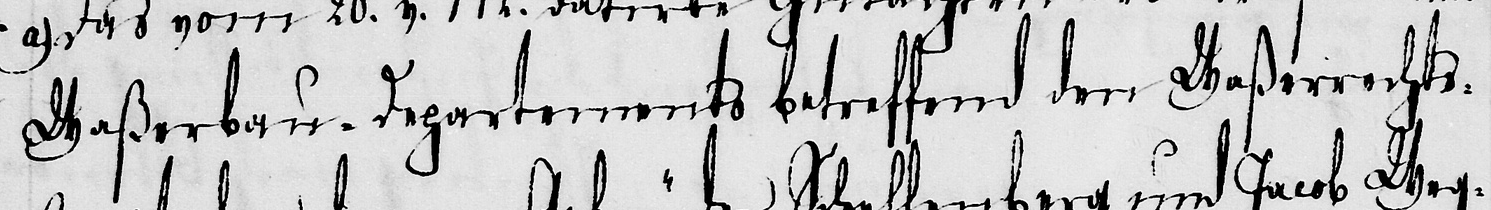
Waßerbau-Departements betreffend den Waßerrechts¬
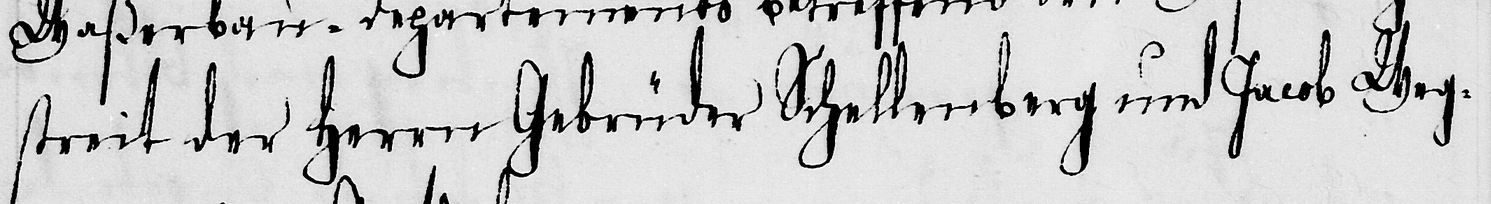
streit der Herrn Gebrüder Schellenberg und Jacob Weg¬
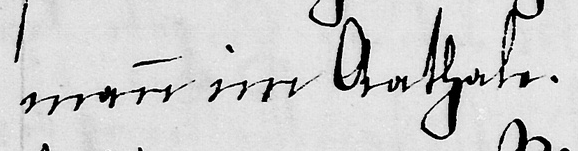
mann im Aathale.
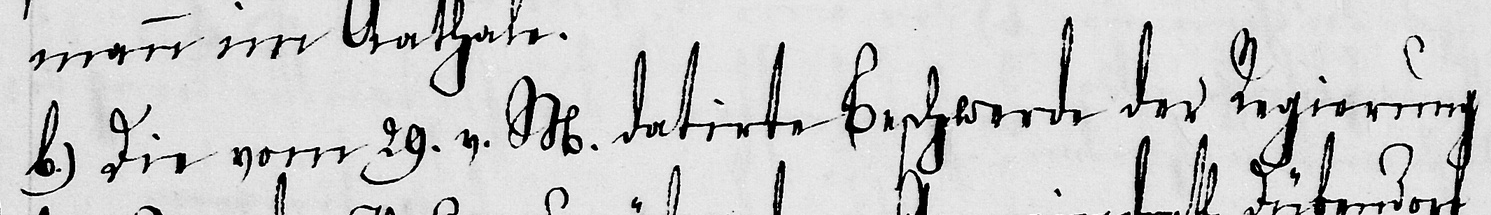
b.) die vom 29. v. M. datirte Beschwerde der Regierung
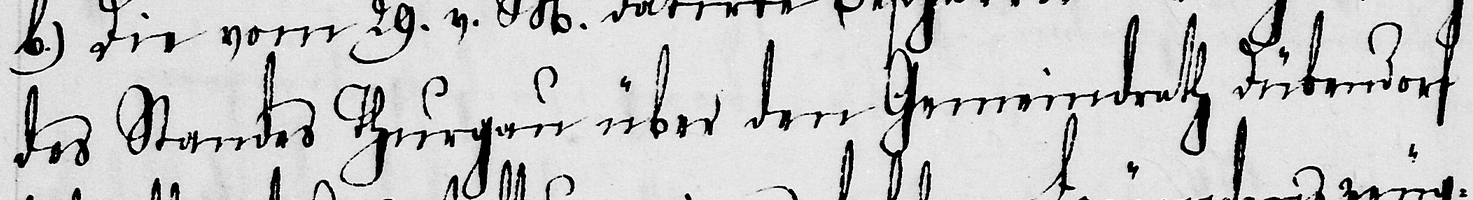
des Standes Thurgau über den Gemeindrath Dübendorf
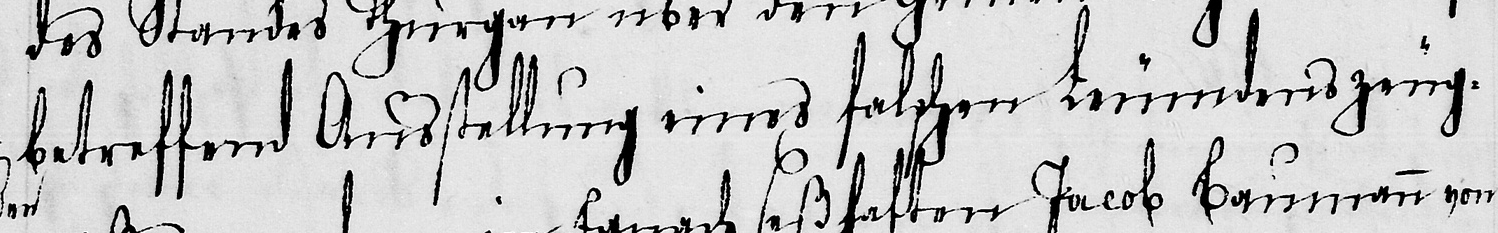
betreffend Ausstellung eines falschen Leumdenszeug¬
